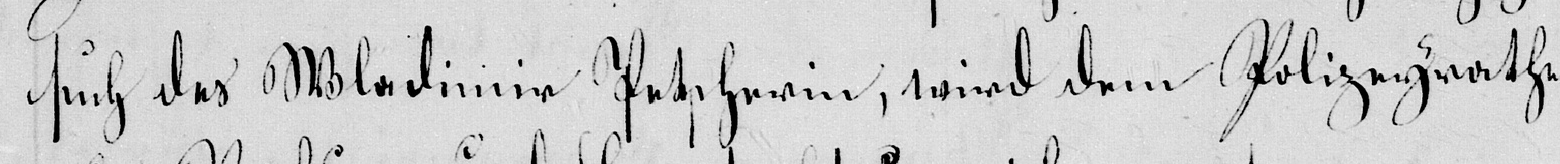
such des Wladimir Petscherin, wird dem Polizeyrathe
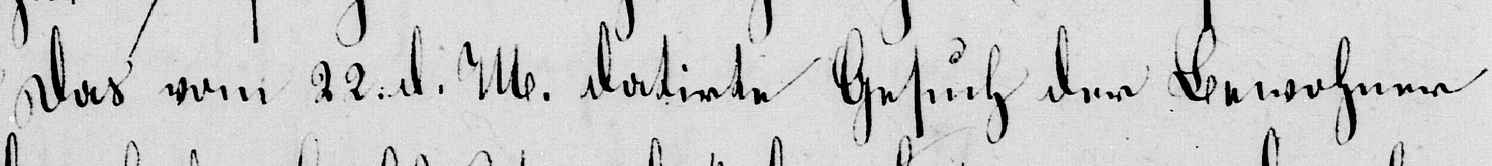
Das vom 22. d. M. datirte Gesuch der Bewohner
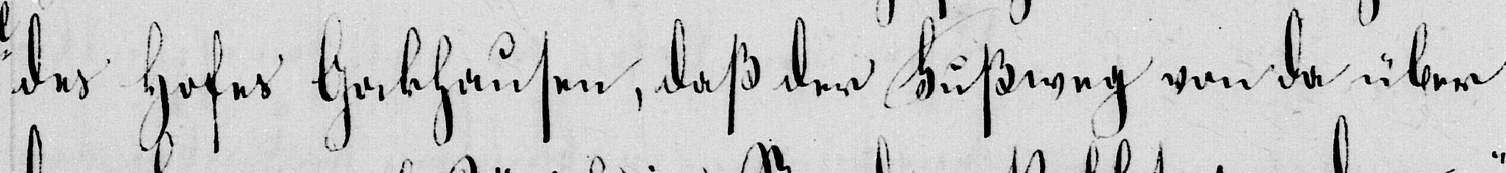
des Hofes Gockhausen, daß der Fußweg von da über
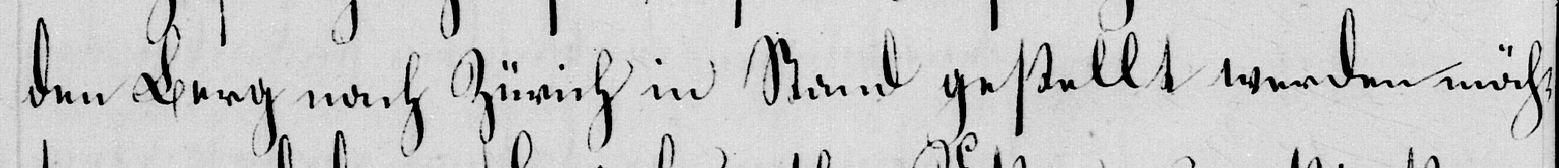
den Berg nach Zürich in Stand gestellt werden möch¬
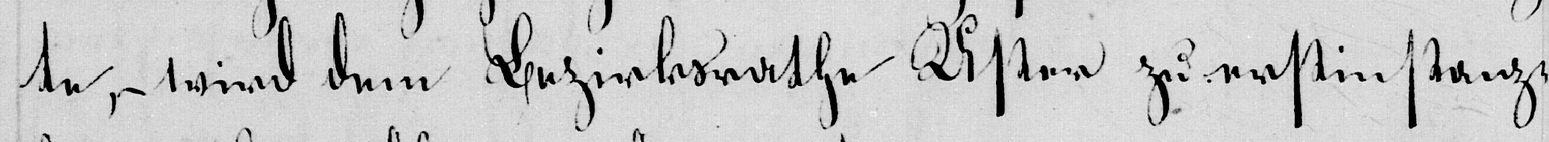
te, – wird dem Bezirksrathe Uster zu erstinstanz¬
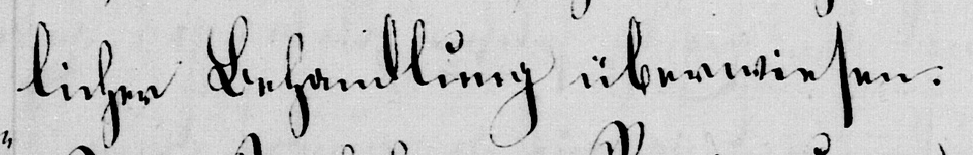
licher Behandlung überwiesen.
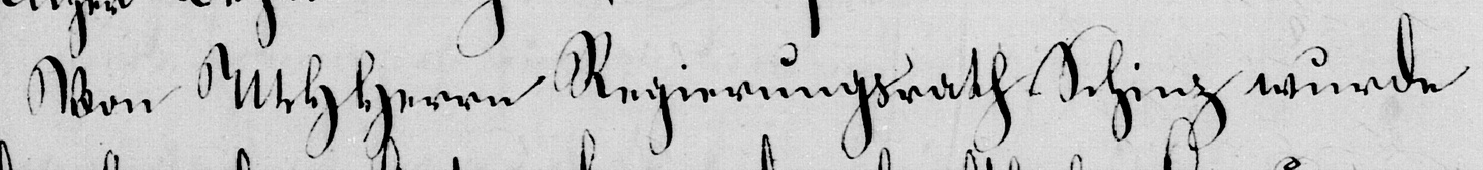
Von MHHerrn Regierungsrath Schinz wurde
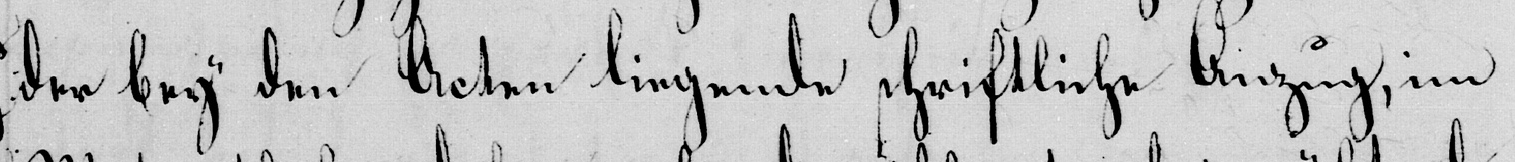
der bey den Acten liegende schriftliche Anzug, im
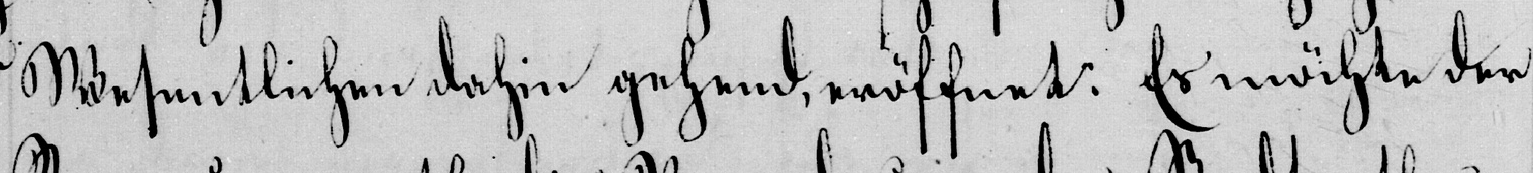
Wesentlichen dahin gehend, eröffnet: Es möchte der
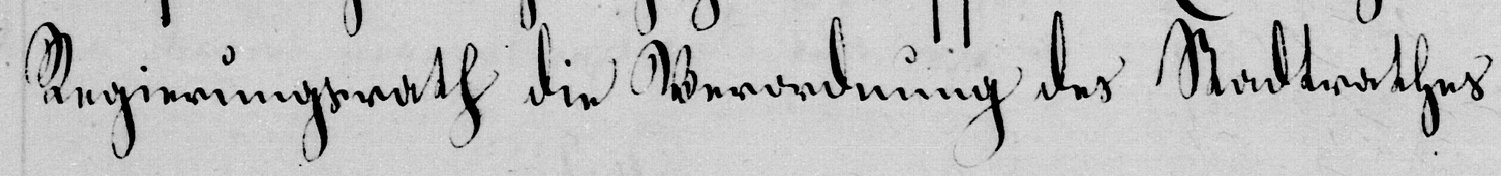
Regierungsrath die Verordnung des Stadtrathes
